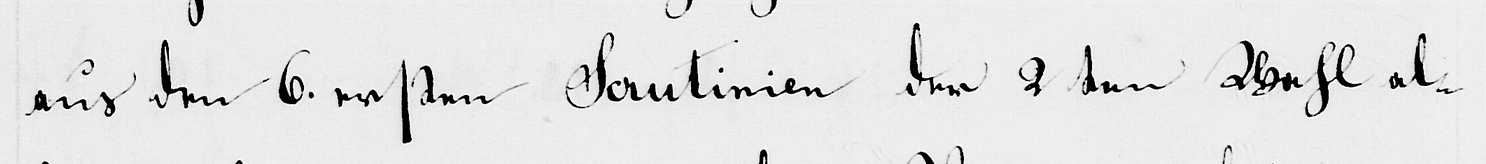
aus den 6. ersten Scrutinien der 2ten Wahl al¬
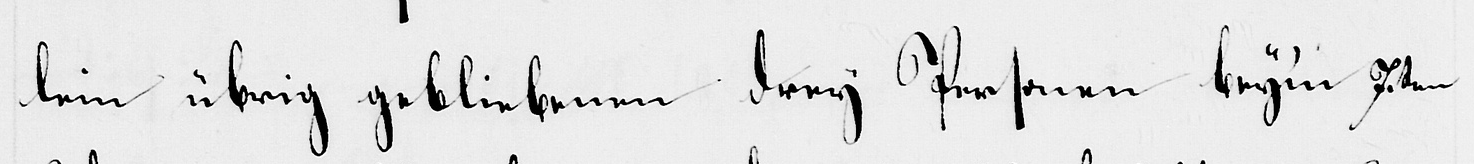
lein übrig gebliebenen drey Personen beym 7.ten
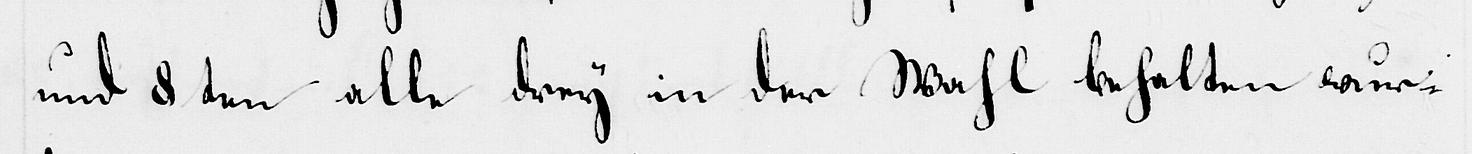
und 8.ten alle drey in der Wahl behalten wur¬
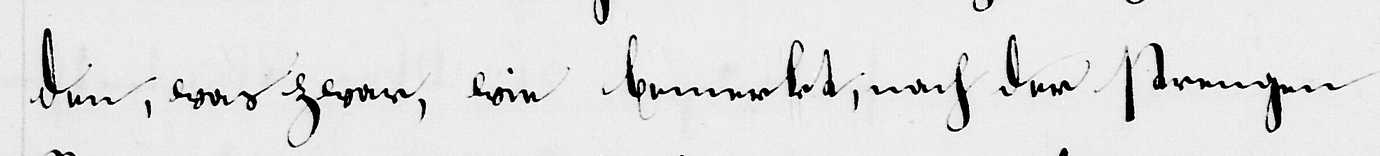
den, was zwar, wie bemerkt, nach der strengen
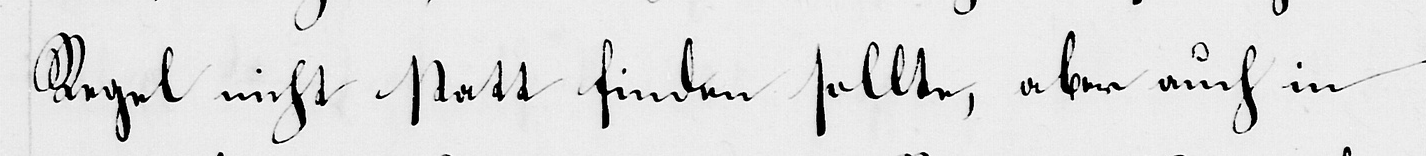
Regel nicht statt finden sollte, aber auch in
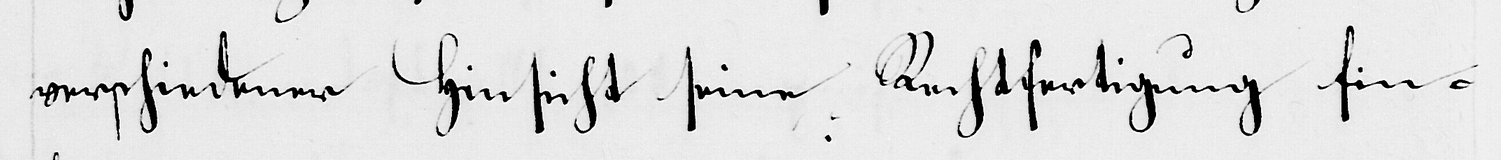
verschiedener Hinsicht seine Rechtfertigung fin¬
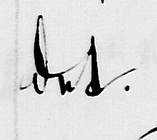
det.
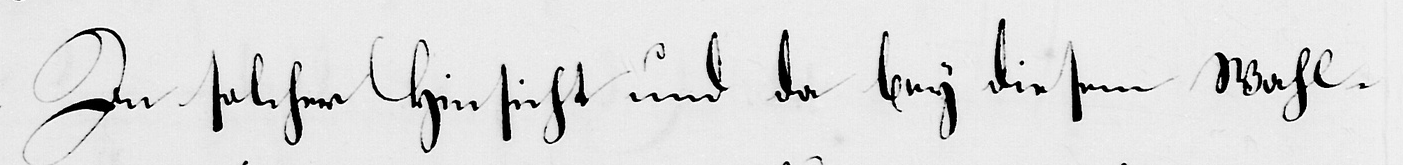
In solcher Hinsicht und da bey diesem Wahl¬
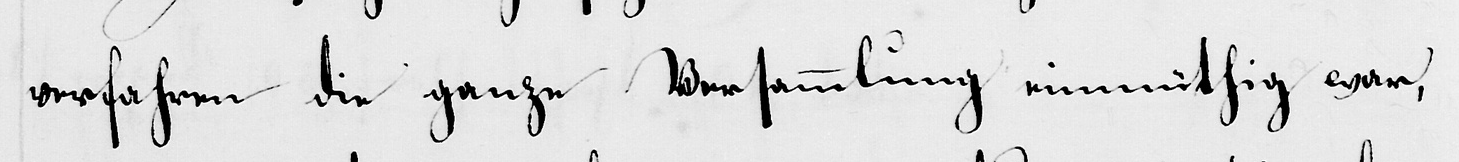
verfahren die ganze Versammlung einmüthig war,
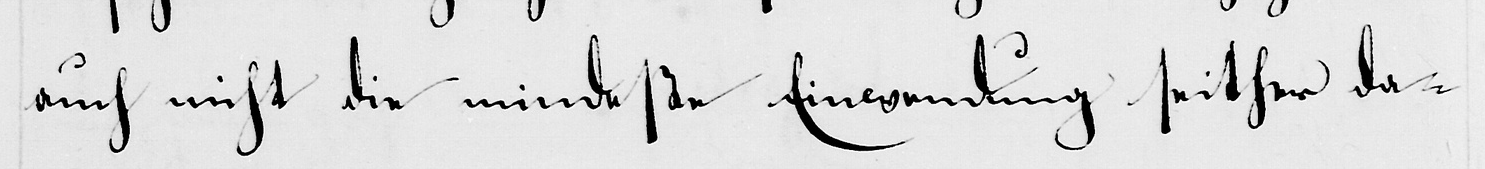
auch nicht die mindeste Einwendung seither da-
